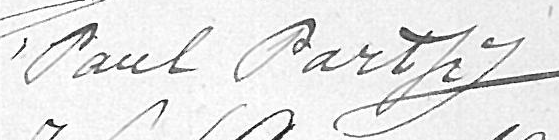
Paul Partsch
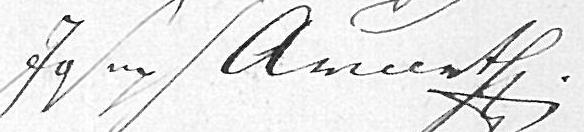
Joseph Arneth
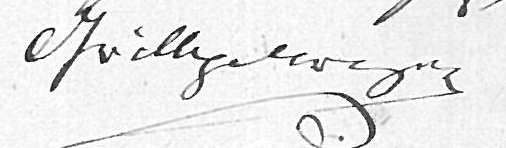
Grillparzer
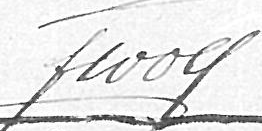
FWolf
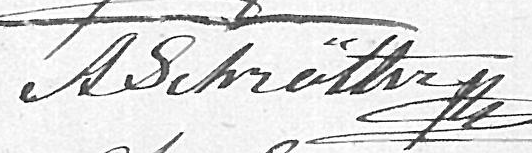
ASchrötter
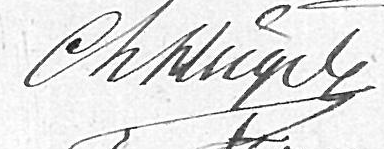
ChHügel
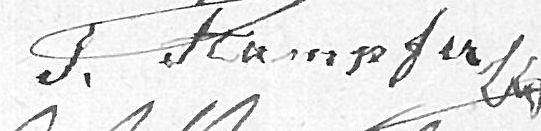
T. Stampfer
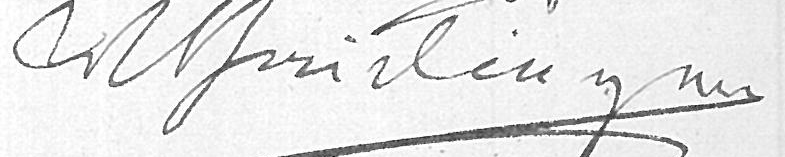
WHaidinger
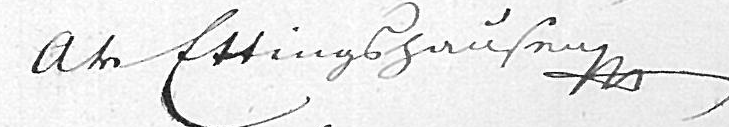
AvEttingshausen
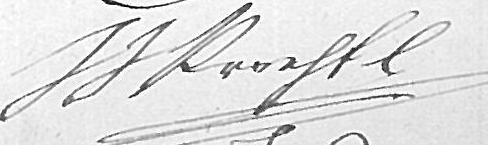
JJPrechtl
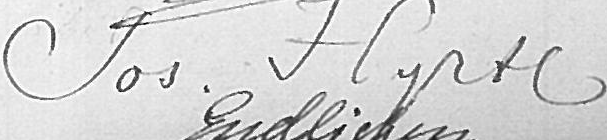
Jos. Hyrtl
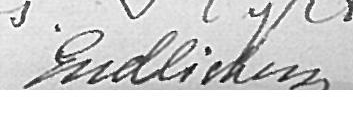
Endlicher
